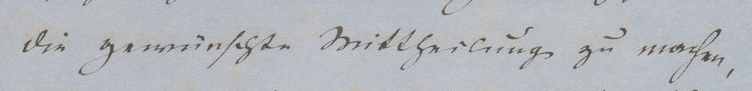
die gewünschte Mittheilung zu machen,
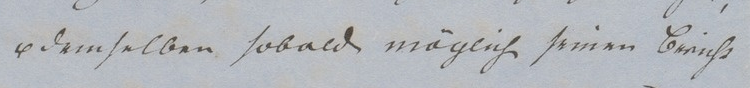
& demselben sobald möglich seinen Bericht
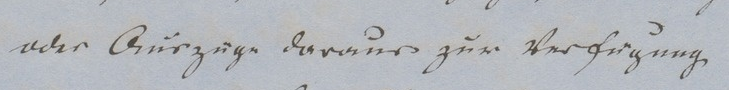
oder Auszüge daraus zur Verfügung
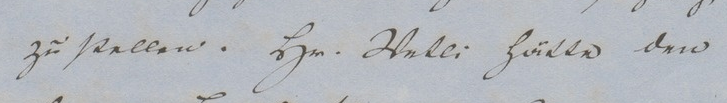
zu stellen. Hr. Wetli hätte den
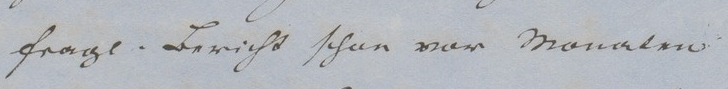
fragl. Bericht schon vor Monaten
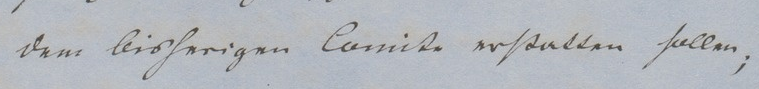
dem bisherigen Comite erstatten sollen;
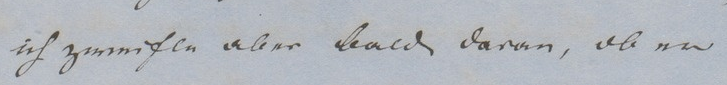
ich zweifle aber bald daran, ob er
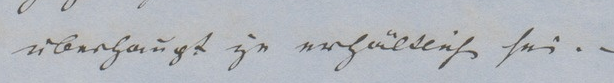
überhaupt je erhältlich sei. –
